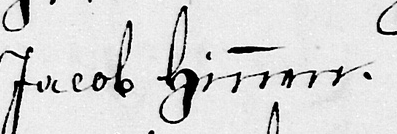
acob Hinnen.
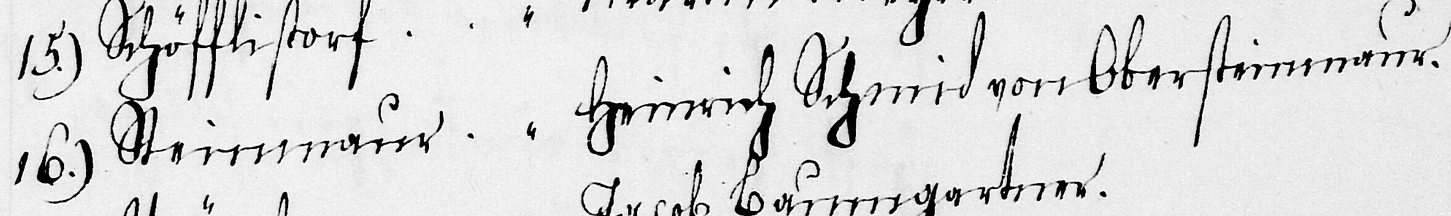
16.) Steinmaur “ Heinrich Schmid von Obersteinmaur.
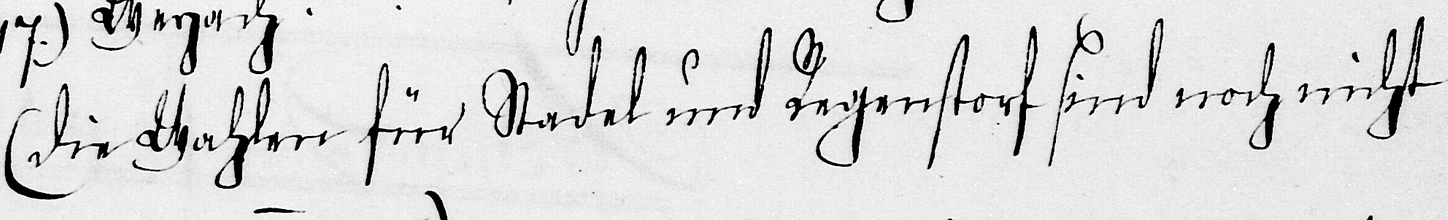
(Die Wahlen für Stadel und Regenstorf sind noch nicht
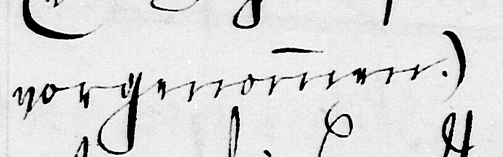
vorgenommen.)
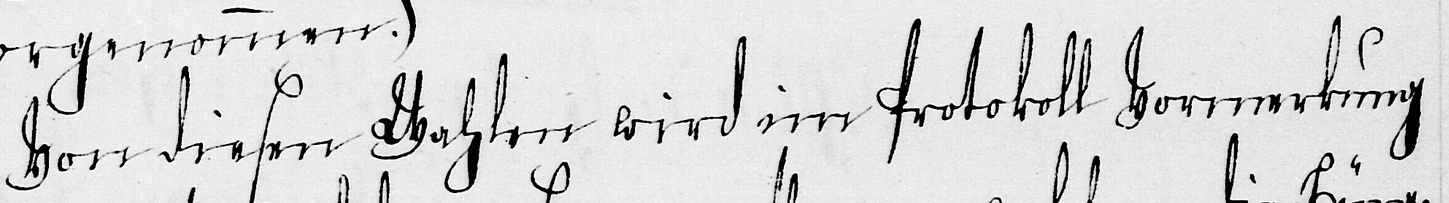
Von diesen Wahlen wird im Protokoll Vormerkung
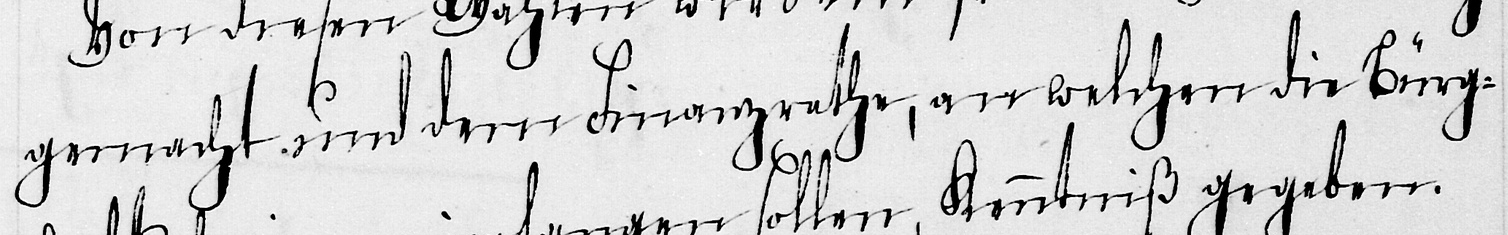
gemacht und dem Finanzrathe, an welchen die Bürg¬
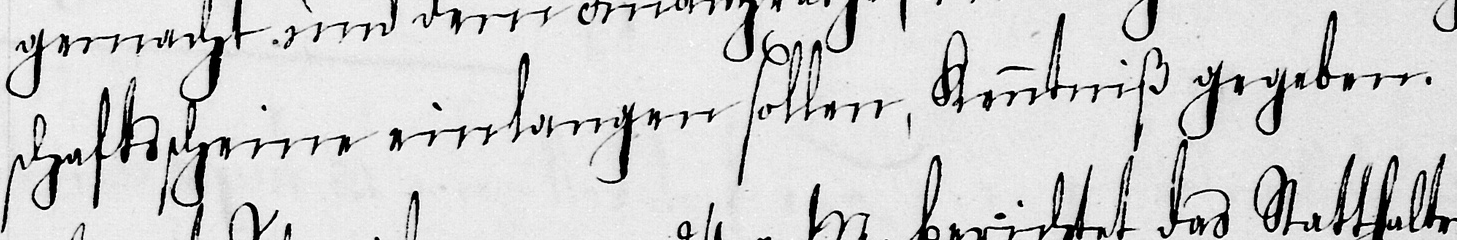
schaftsscheine einlangen sollen, Kenntniß gegeben.
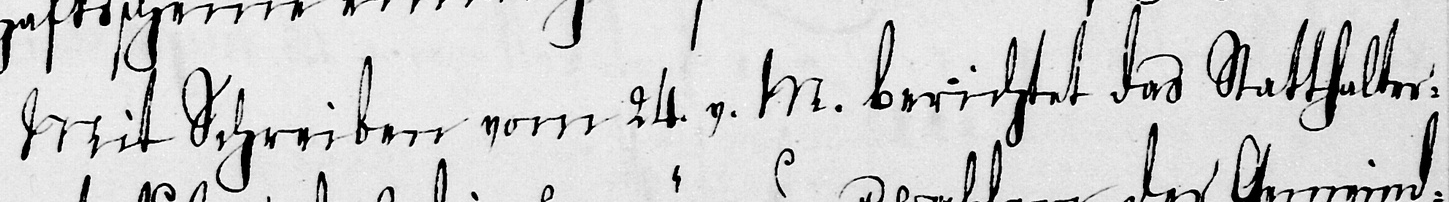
Mit Schreiben vom 24. v. M. berichtet das Statthalter¬
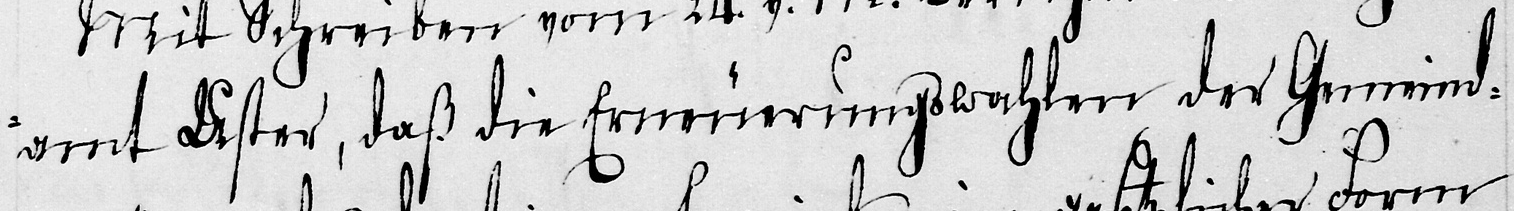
amt Uster, daß die Erneuerungswahlen der Gemeind¬
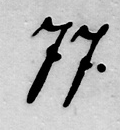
17.)
